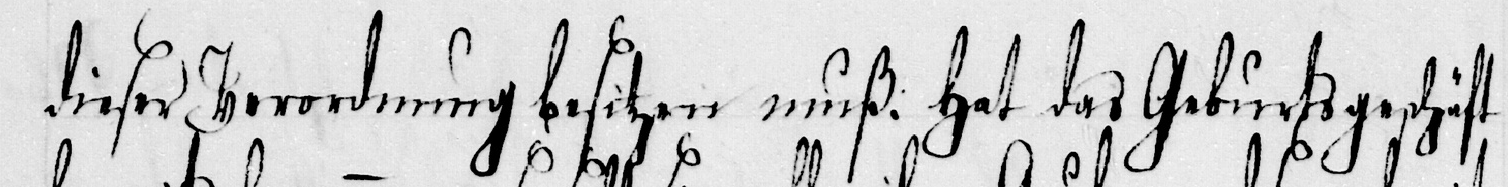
dieser Verordnung besitzen muß. Hat das Geburtsgeschä¬
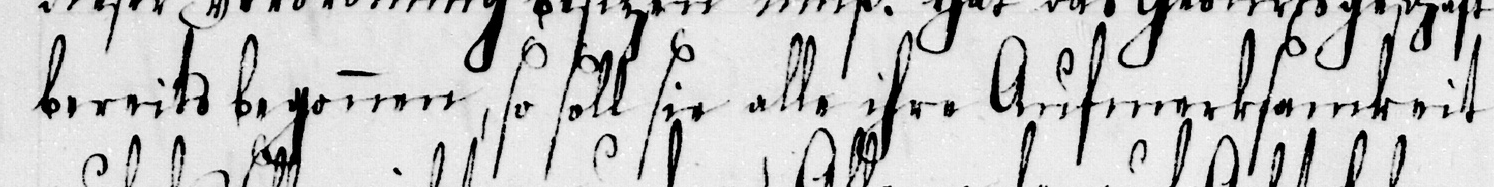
bereits begonnen, so soll sie alle ihre Aufmerksamkeit
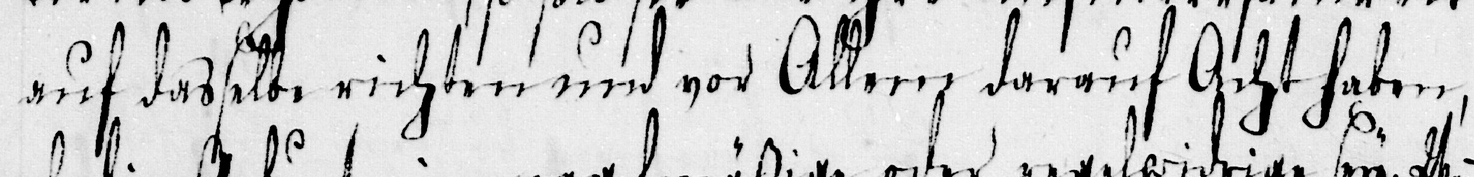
auf dasselbe richten und vor Allem darauf Acht haben,
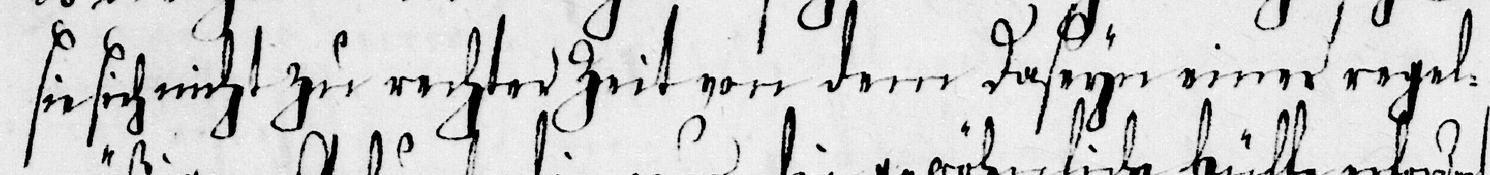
sie sich nicht zur rechten Zeit von dem Daseyn einer regel¬
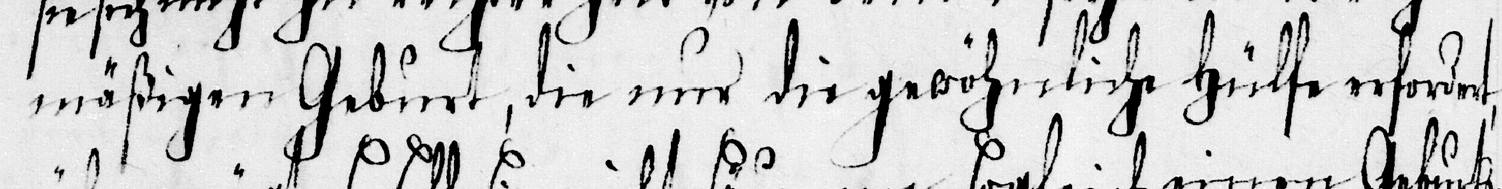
mäßigen Geburt, die nur die gewöhnliche Hülfe erforde¬
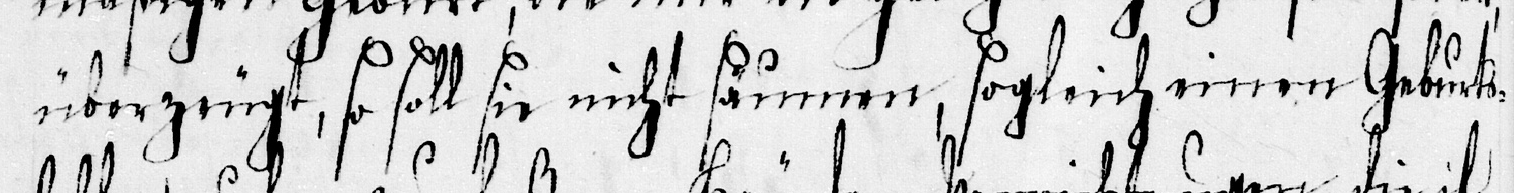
überzeugt, so soll sie nicht säumen, sogleich einen Gebur¬
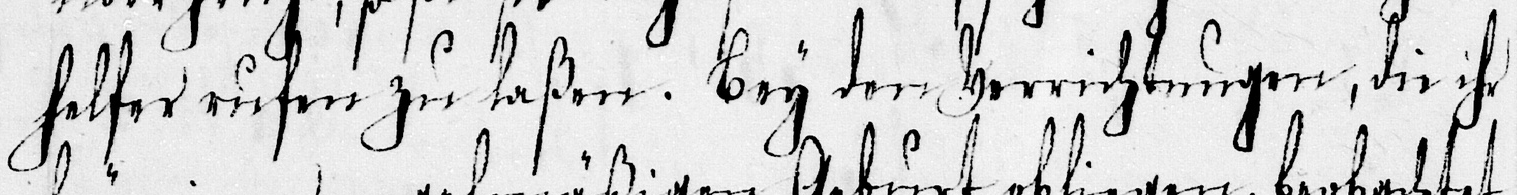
helfer rufen zu laßen. Bey den Verrichtungen, die i¬
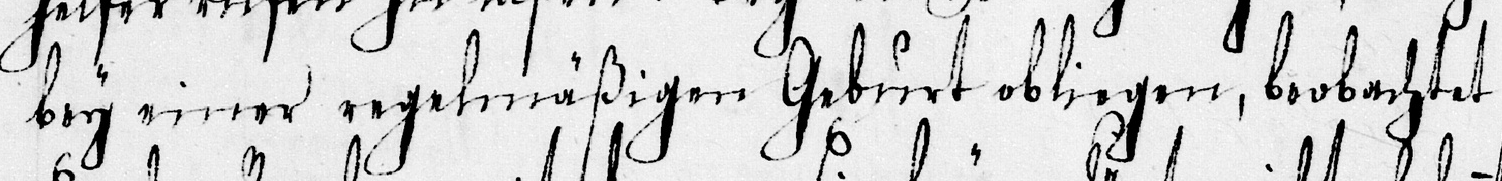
bey einer regelmäßigen Geburt obliegen, beobachtet
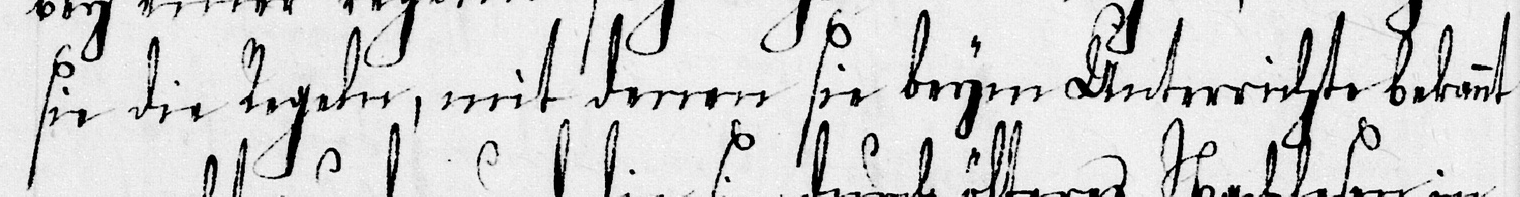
sie die Regeln, mit denen sie beym Unterrichte bekan¬
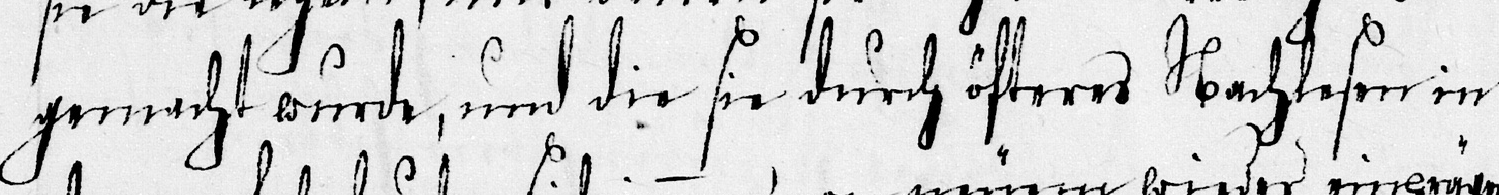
gemacht wurde, und die sie durch öfteres Nachlesen in
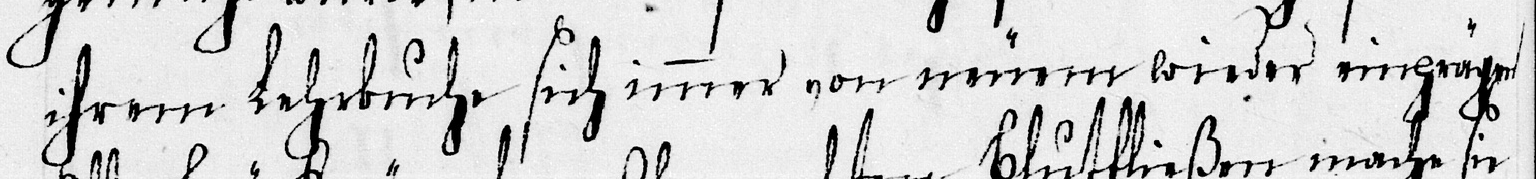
ihrem Lehrbuche sich immer von neuem wieder einprägen
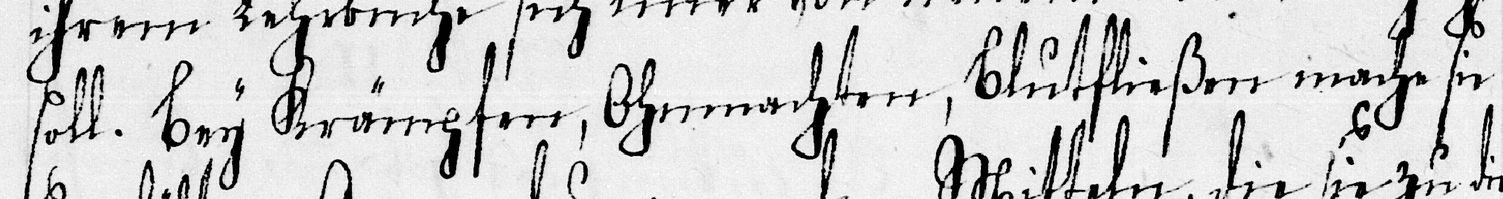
soll. Bey Krämpfen, Ohnmachten, Blutfließen mache sie
